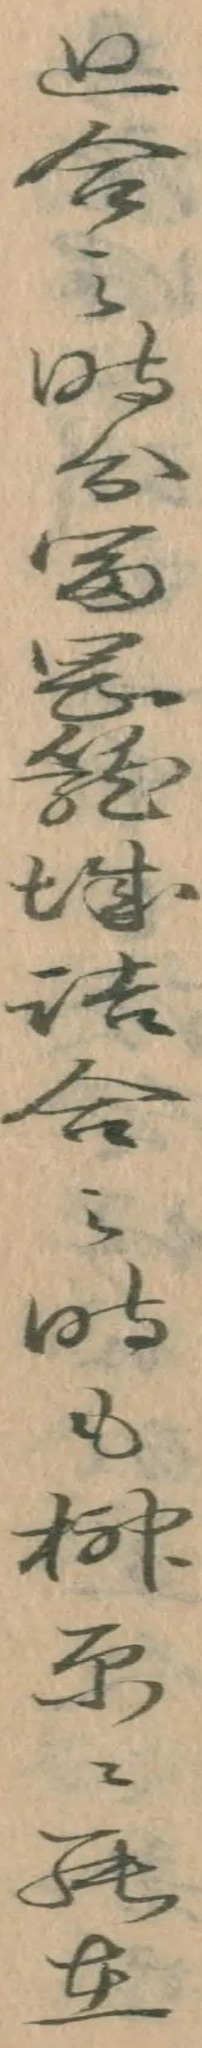廻合之時分冨岡籠城詰合之時も榊原に罷在
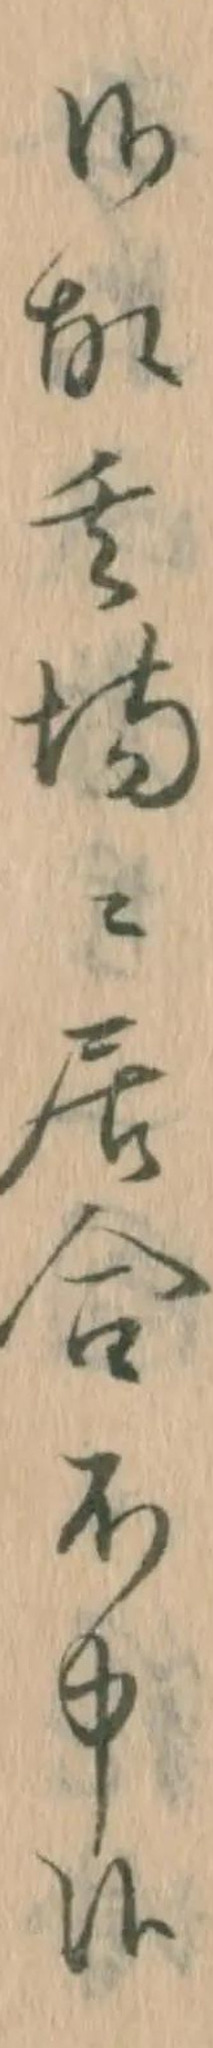候故其場に居合不申候
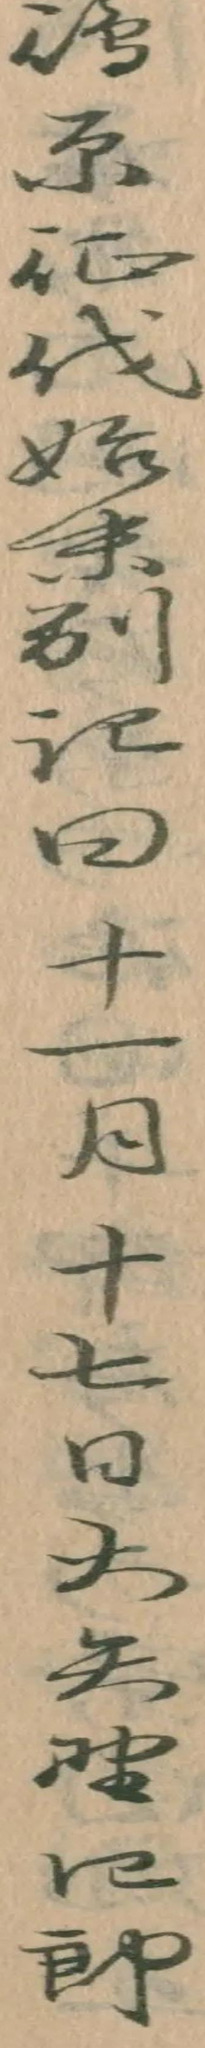島原征伐始末別記曰十一月十七日大矢野四郎
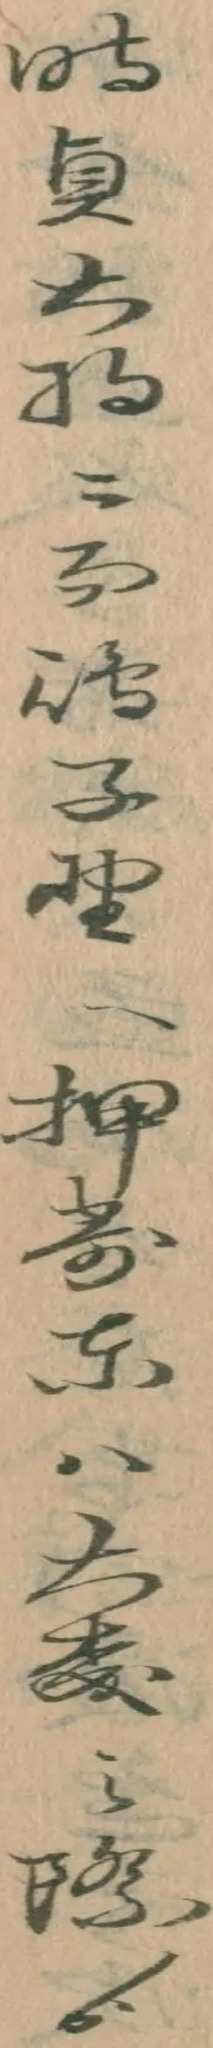時貞大将に而島子野へ押寄東は大森之際ゟ
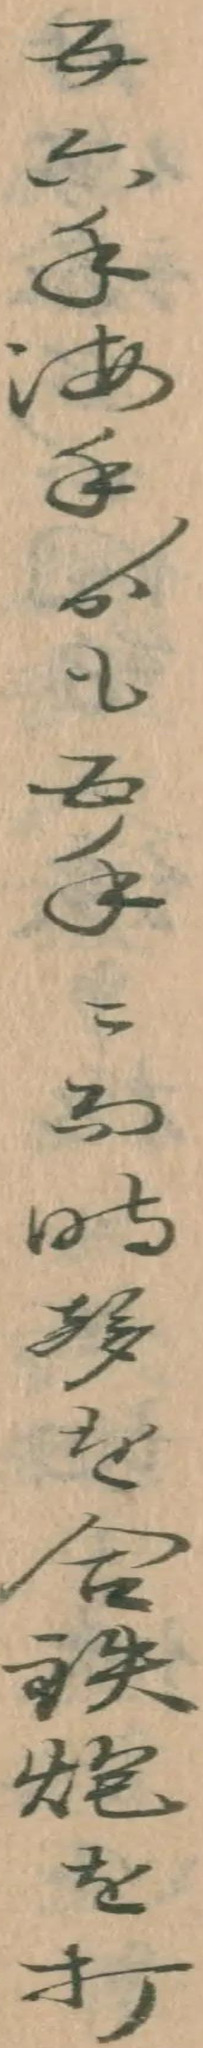五六手海手ゟも五手に而時声を合鉄炮を打
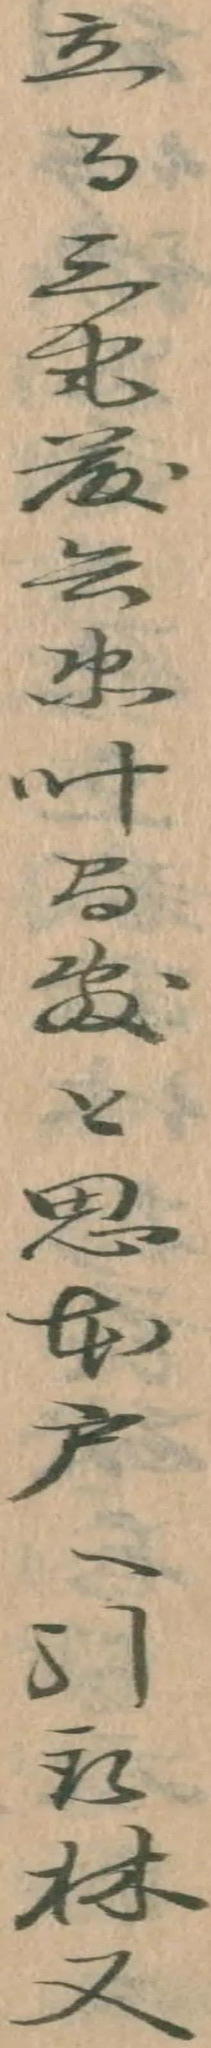立る三宅藤兵衛叶間敷と思本戸へ引取林又
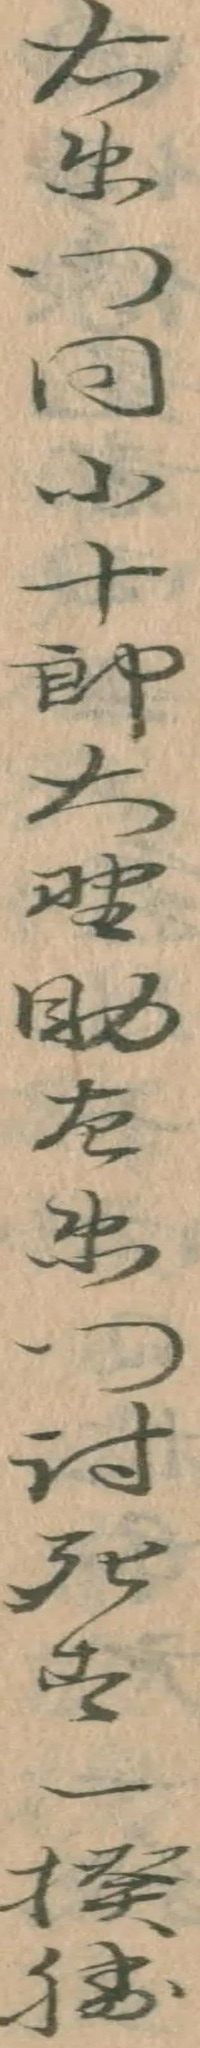右衛門同小十郎大野助左衛門討死春一揆勝
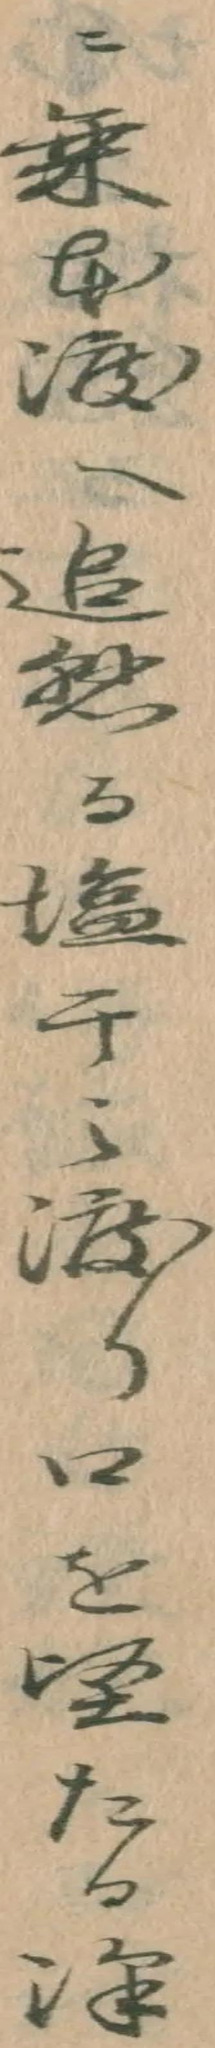に乗本渡へ追懸る塩干之渡り口を堅たる沢
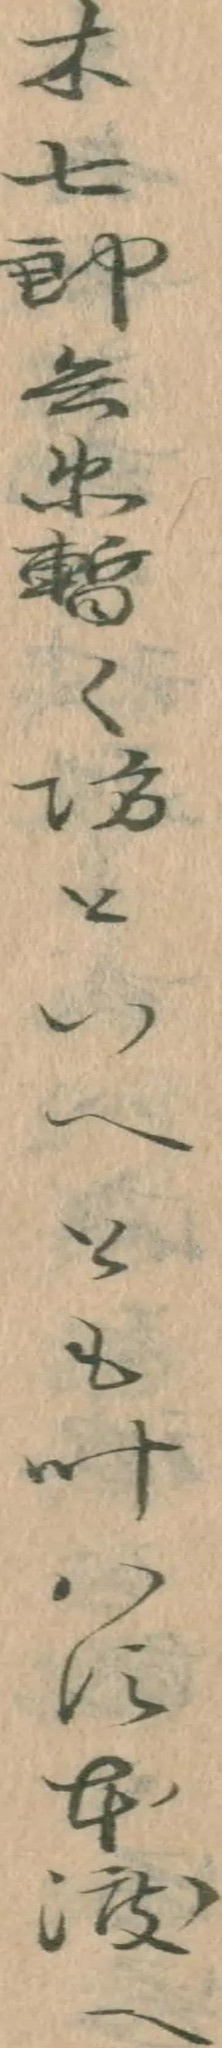木七郎兵衛暫く防といへとも叶は須本渡へ
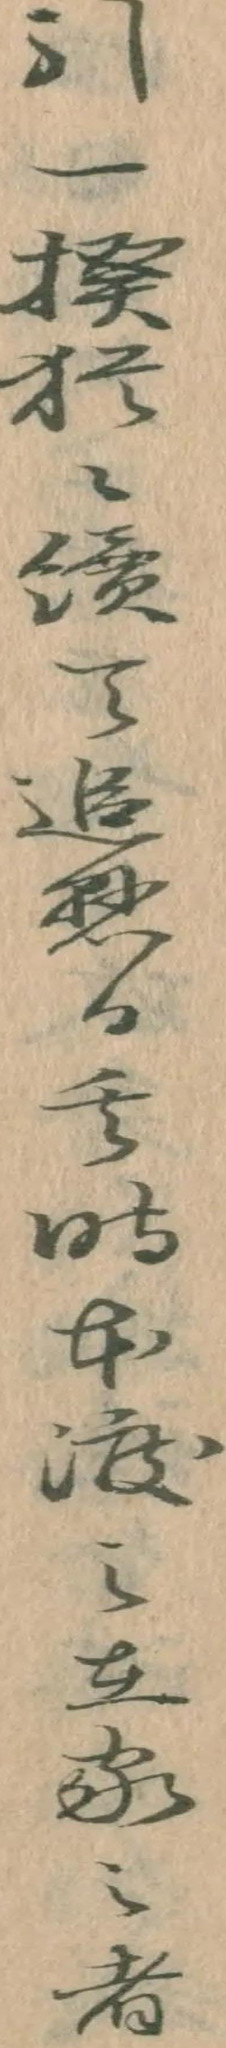引一揆猶々続て追懸る其時本渡之在家之者
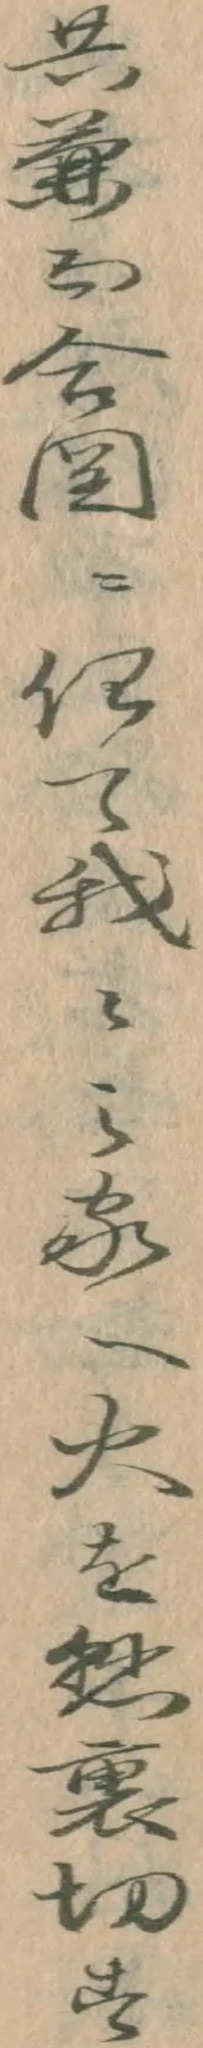共兼而合図に任て我々之家へ火を懸裏切春
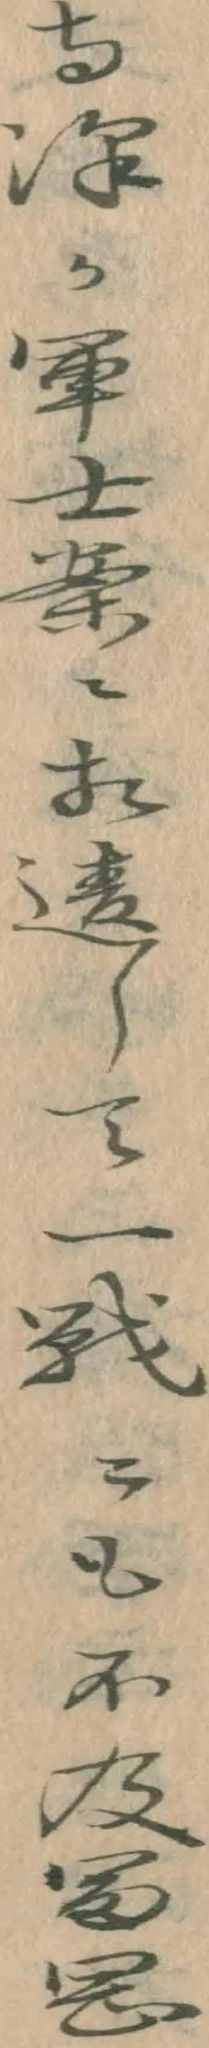寺沢か軍士案に相違して一戦にも不及冨岡
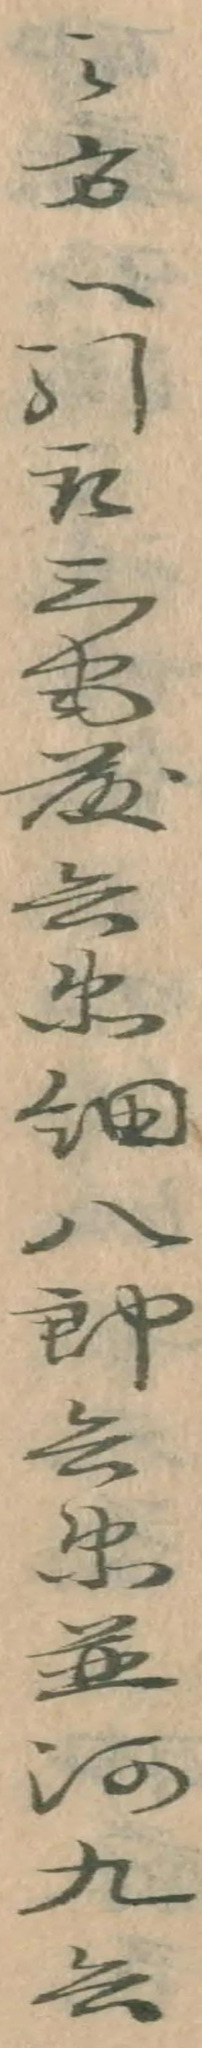之方へ引取三宅藤兵衛畑八郎兵衛並河九兵
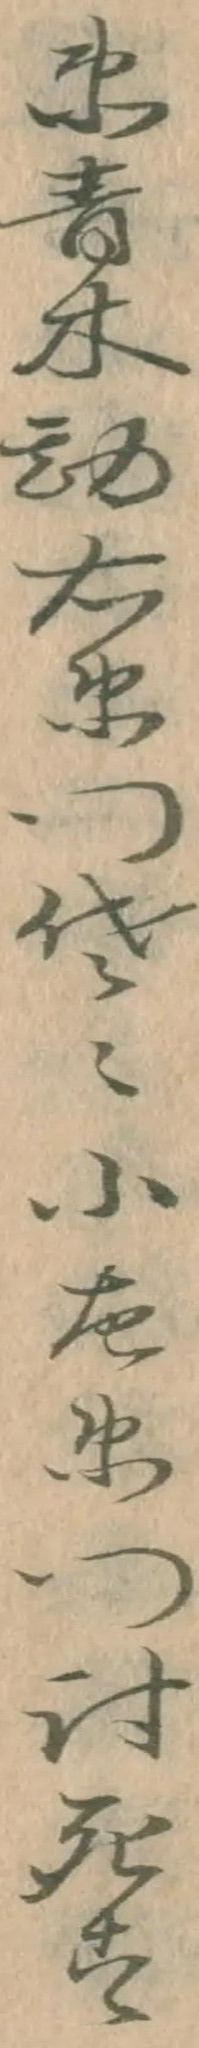衛青木勘右衛門佐々小左衛門討死春

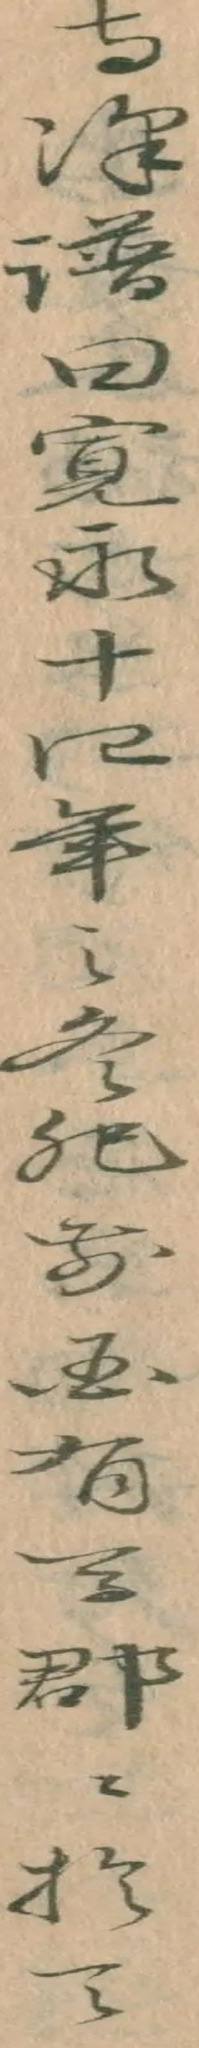寺沢譜曰寛永十四年之冬肥前国有馬郡に於て
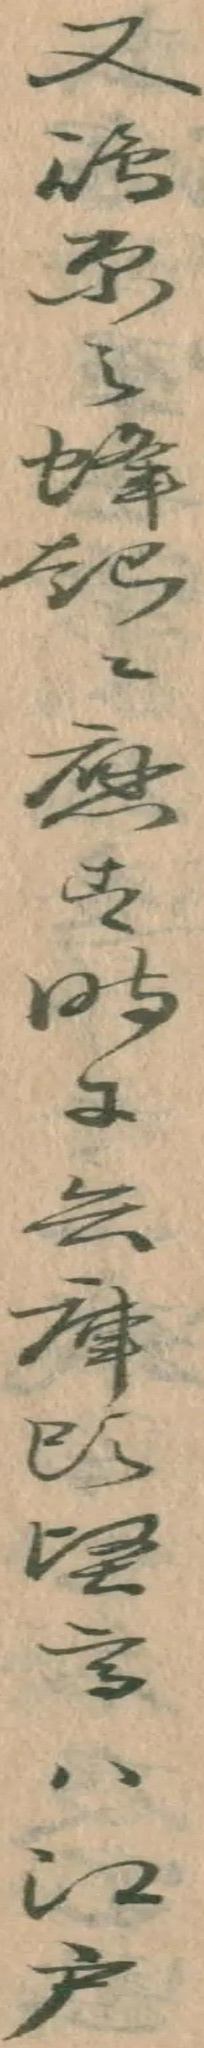又島原之蜂起に応春時尓兵庫頭堅高は江戸
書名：切支丹御退治記 49巻. [2]
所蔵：国立国会図書館 National Diet Library, JAPAN
